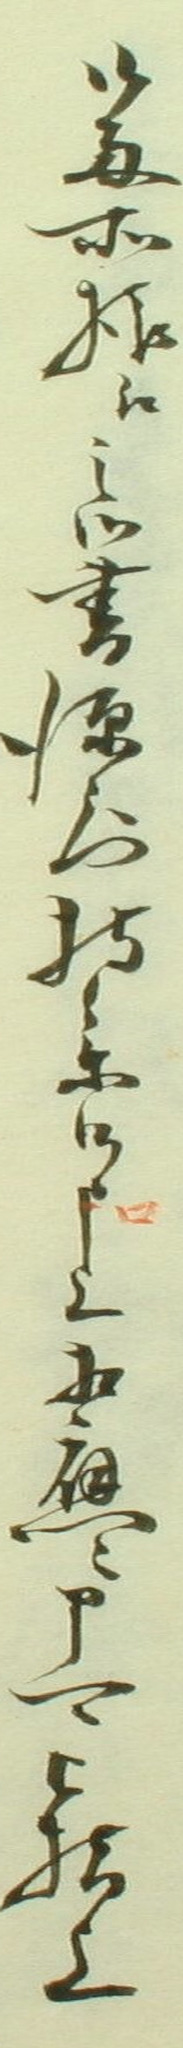御両所様江之御書源右衛門持参御申上相応ニ申可被指上
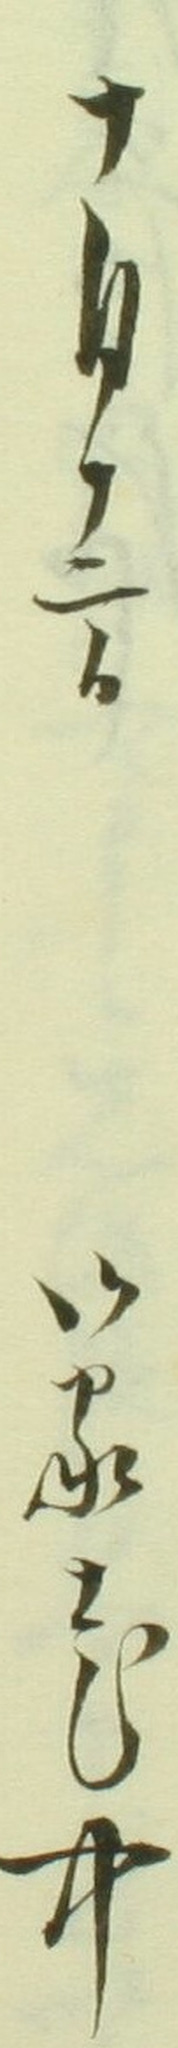十月十二日御家老中
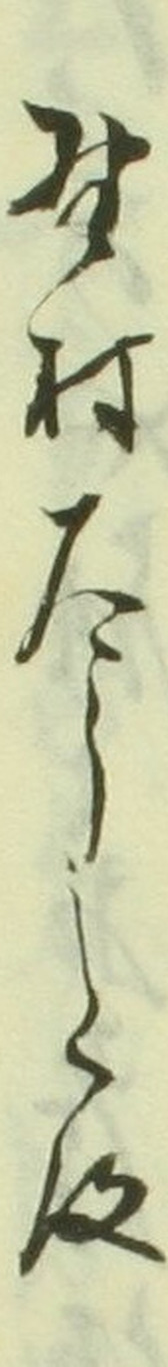野村太郎殿
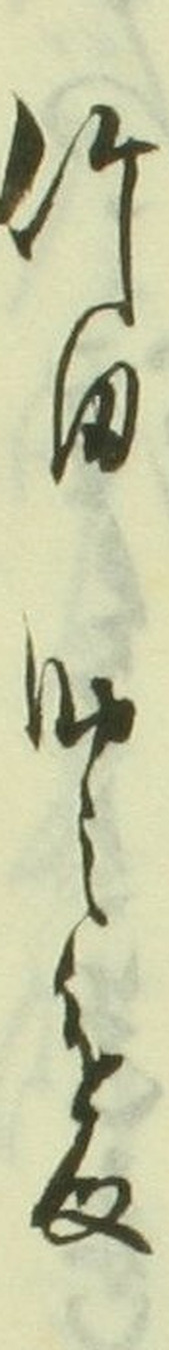竹田助之進殿
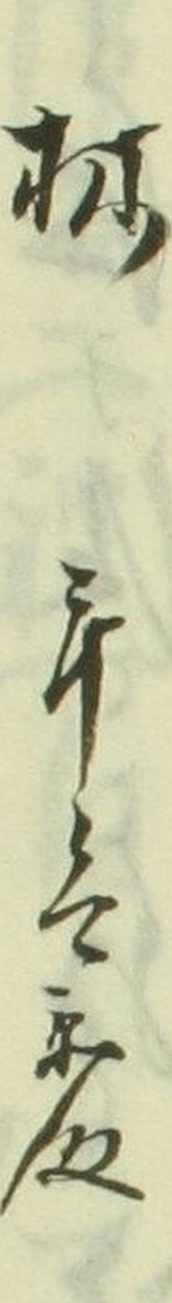林平兵衛殿
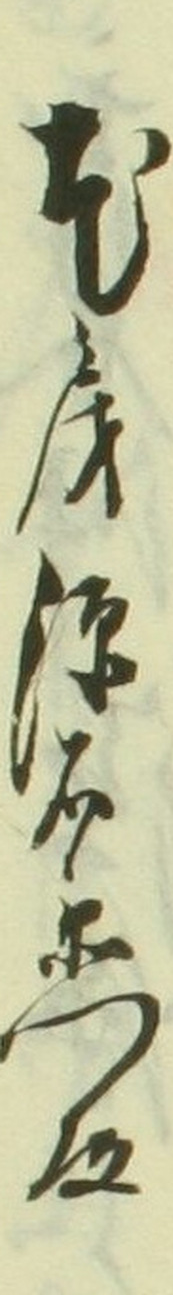花房源右衛門殿
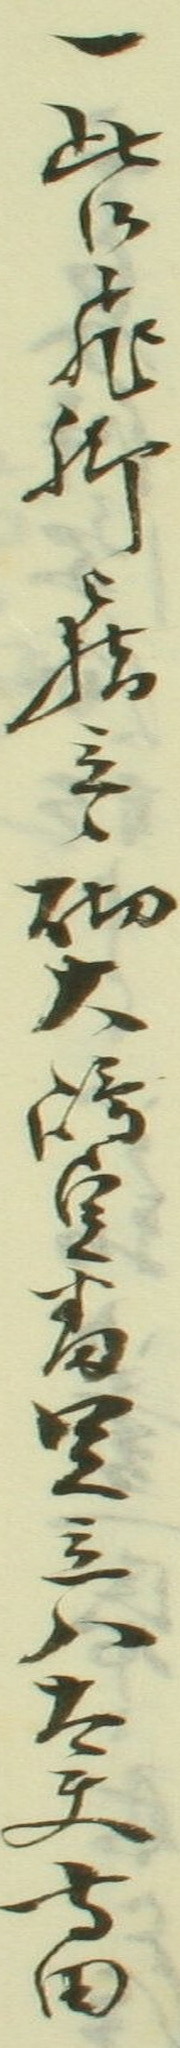一此御飛脚被指立候砌大嶋定番足立八太夫寺田
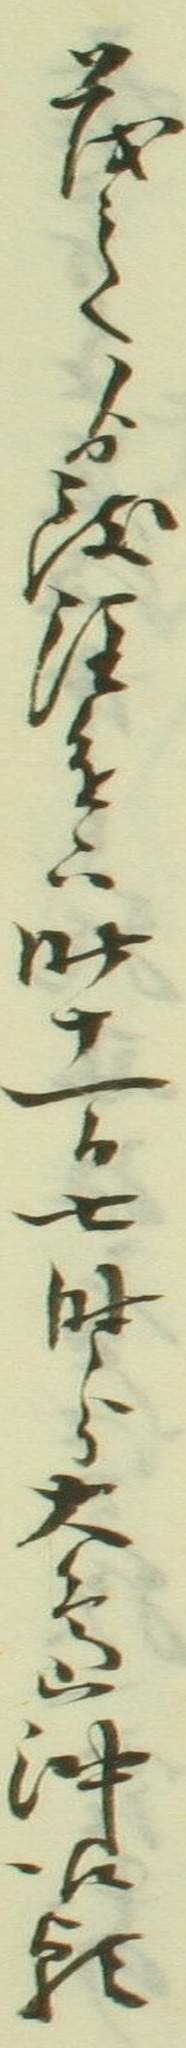茂ゟ致注進候ハ昨十一日七時分大嶋沖江朝
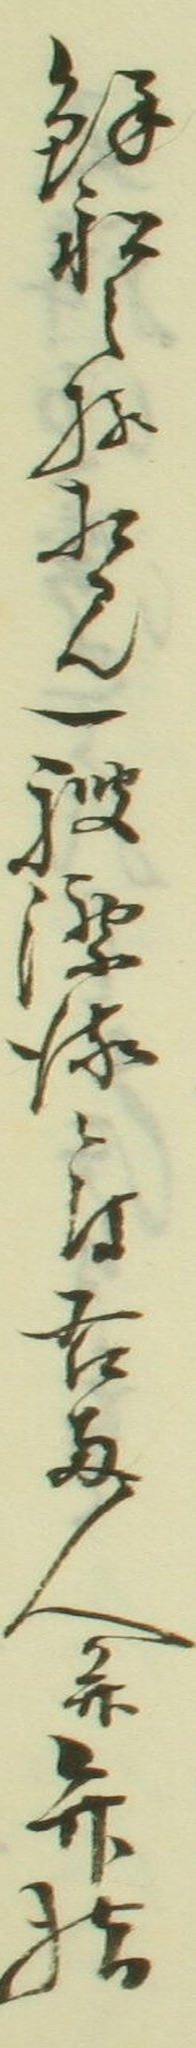鮮船之様相見一艘漂流ニ付右両人并弁指
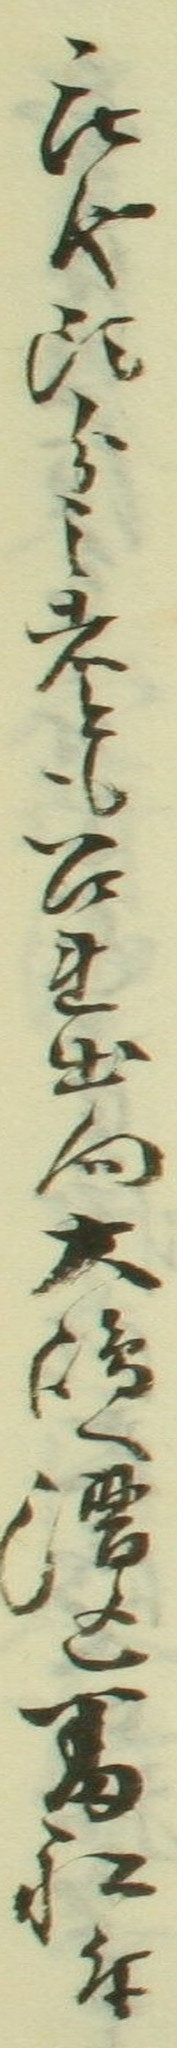庄や頭分之者とも召連出向大嶋へ漕込番船付

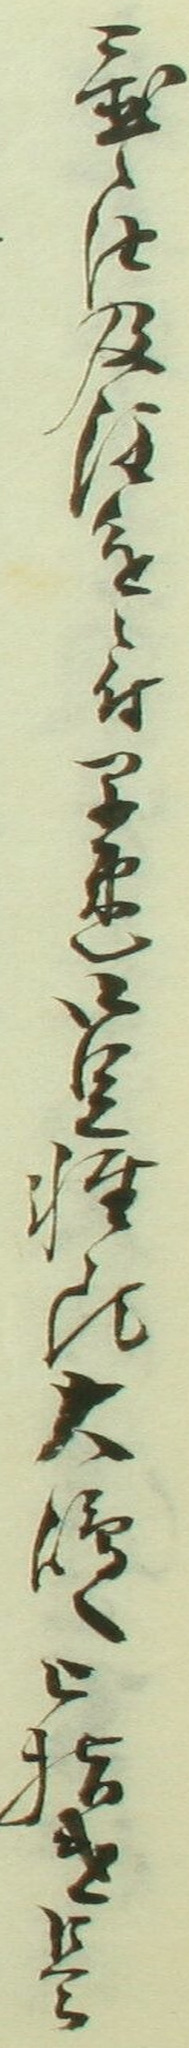置候仕及注進ニ付早速御足軽頭大嶋へ被指遣是
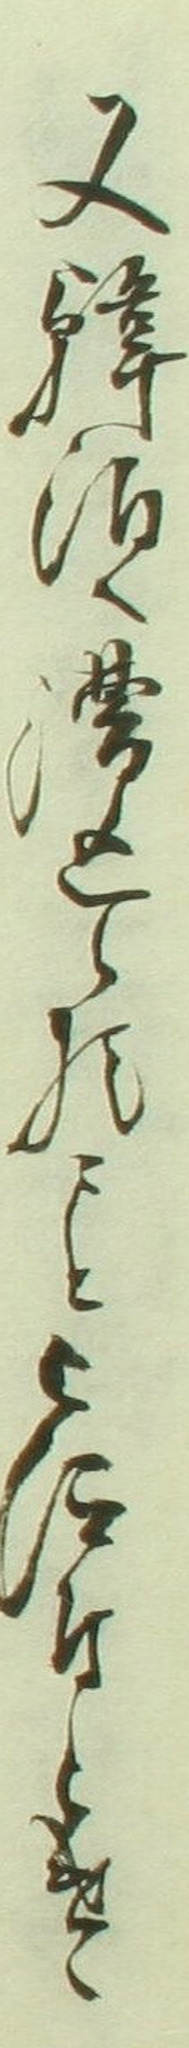又韓泊へ漕込候様ニと被仰付被遣候
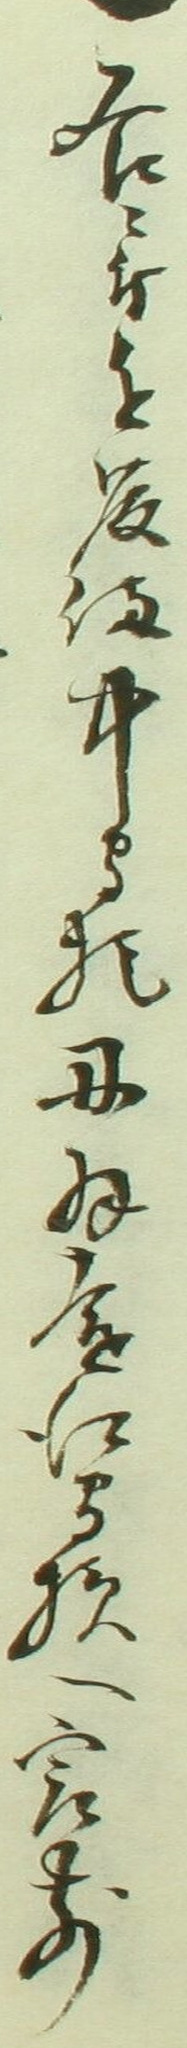一右ニ付近藤備中守様丹羽遠江守様へ最前
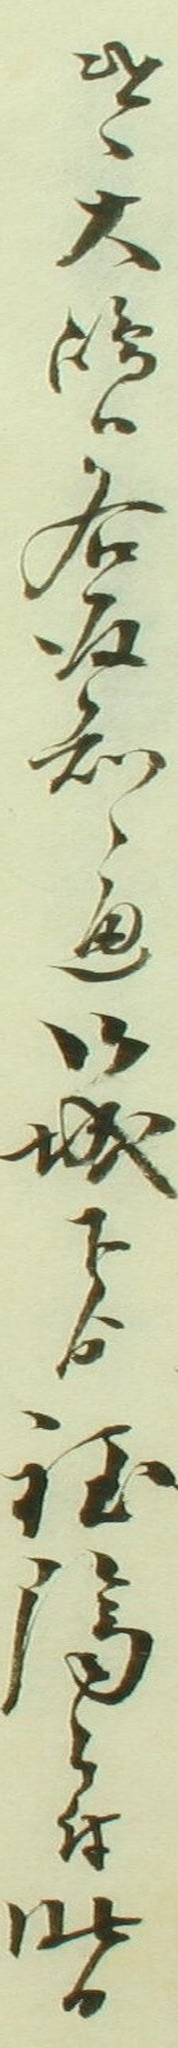遣候大嶋ハ各存知候通御城下ゟ程隔ニ付昨日
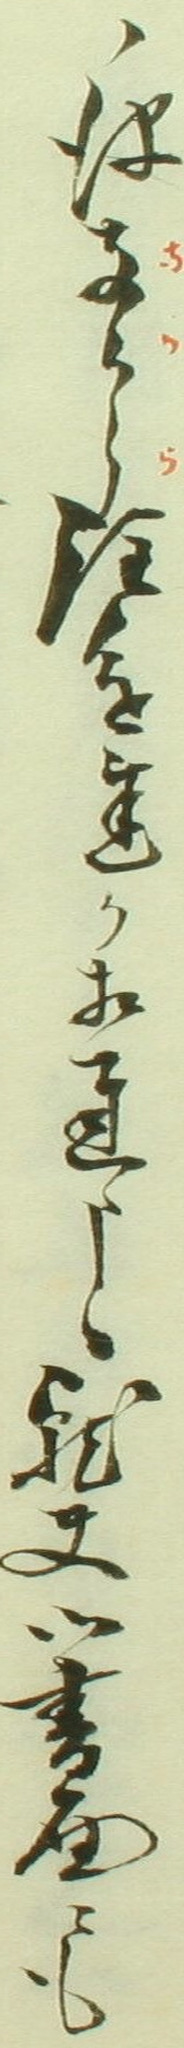ノ儀なから注進違遅ク相達申候就夫御書面にも
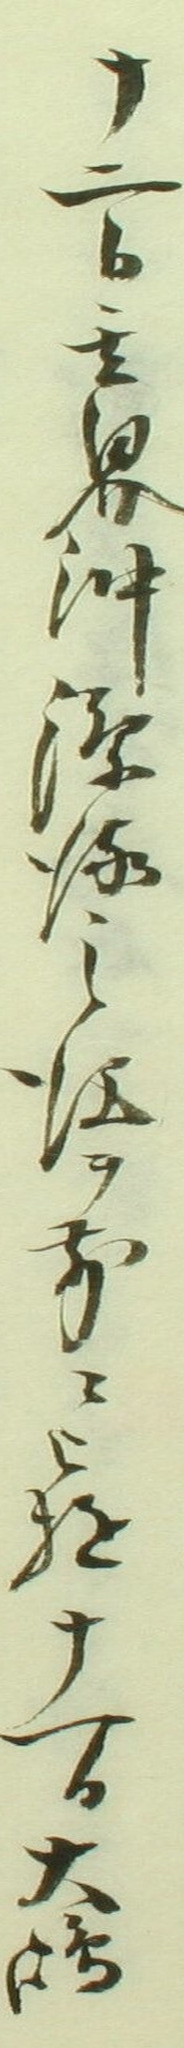十二日玄界沖漂流之儀ヲ前ニ被遊十一日大嶋
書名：異国船漂着記
